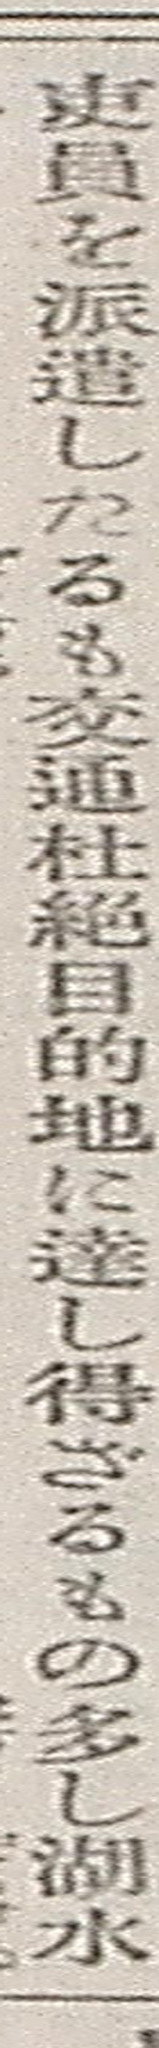吏員を派遣したるも交通杜絶目的地に達し得ざるもの多し湖水
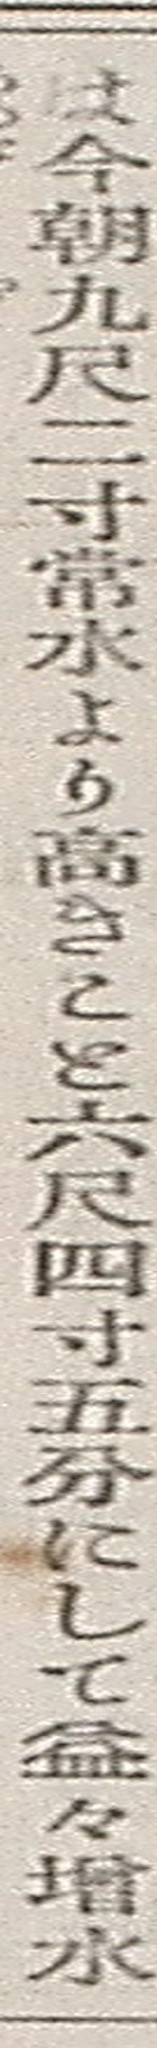は今朝九尺五寸常水より高きこと六尺四寸五分にして益々増水
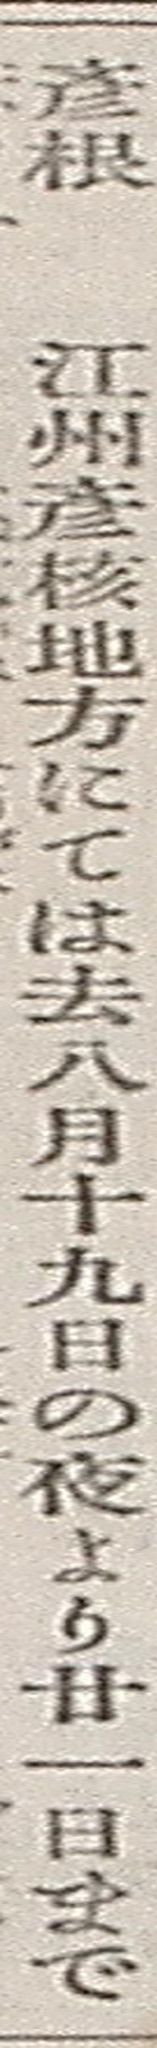彦根江州彦核地方にては去八月十九日の夜より廿一日まで
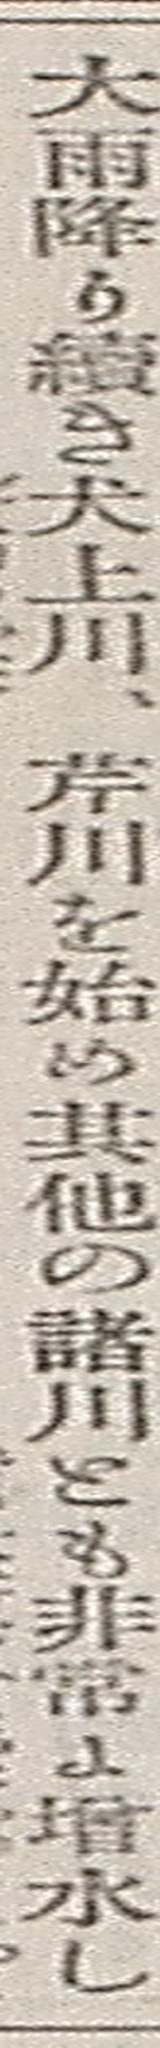大雨降り続き犬上川、芹川を始め其他の諸川とも非常に増水し
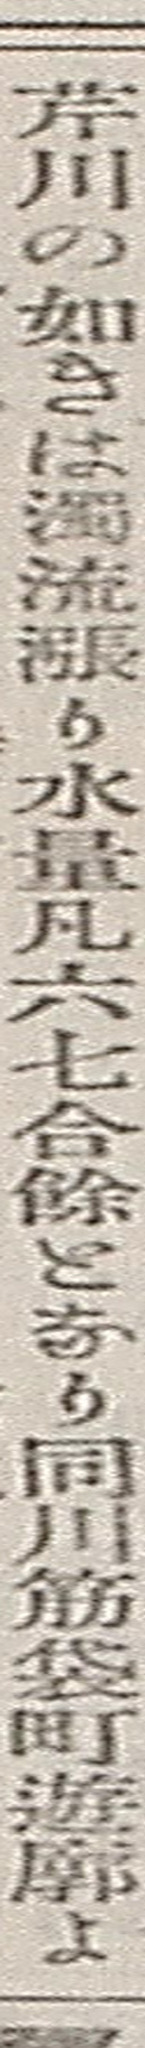芹川の如きは濁流漲り水量凡六七餘合となり同川筋袋町遊郭よ
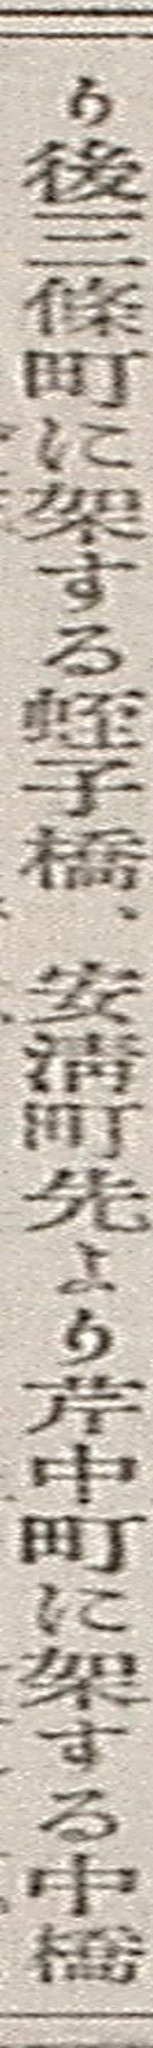り後三條町に架する蛭子橋、安清町先より芹中町に架する中橋
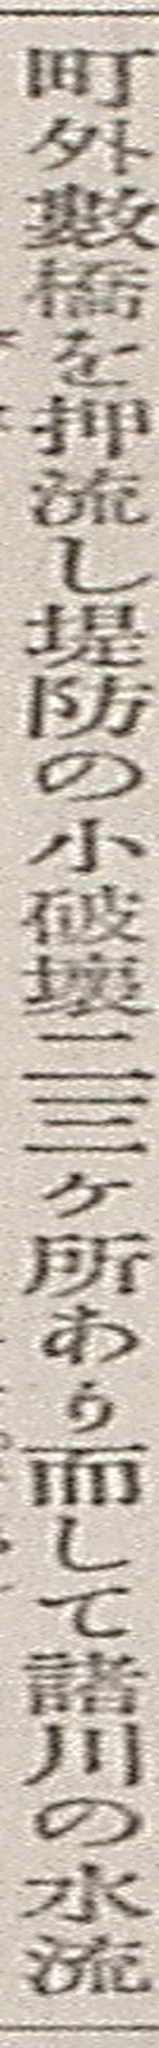町外数橋を押流し堤防の小破壊二三ヶ所あり而して諸川の水流
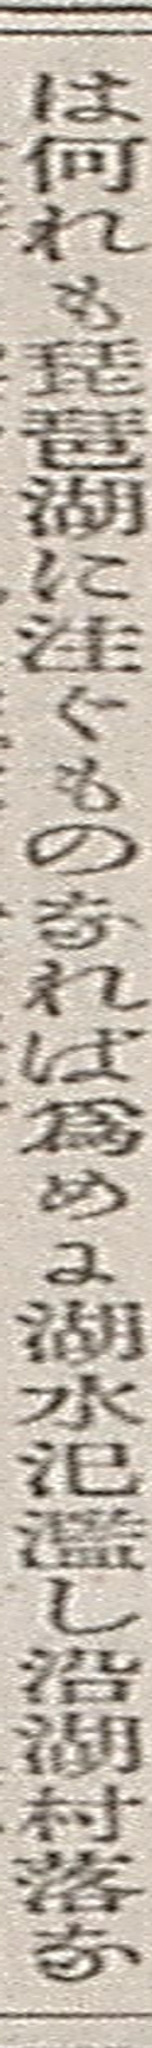は何れも琵琶湖に注ぐものなれば為めに湖水氾濫し沿湖村落な
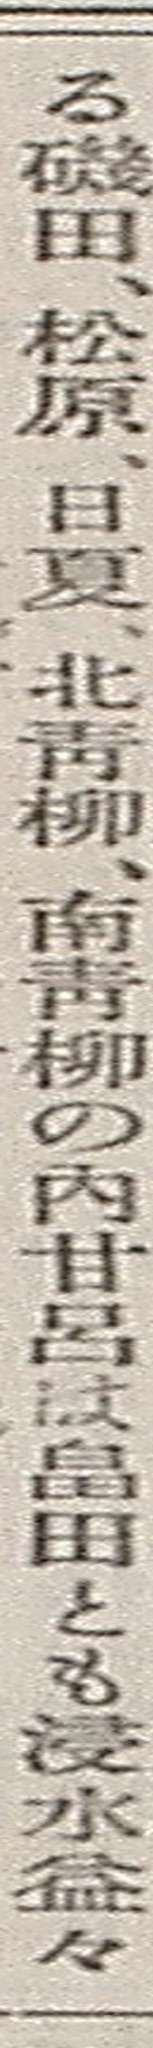る磯田、松原、日夏、北青柳、南青柳の内甘呂は畠田とも浸水益々
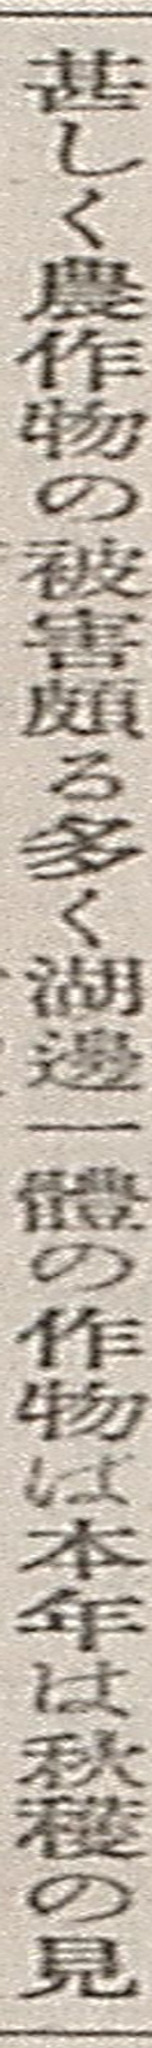甚しく農作物の被害頗る多く湖辺一体の作物は本年は秋穫の見
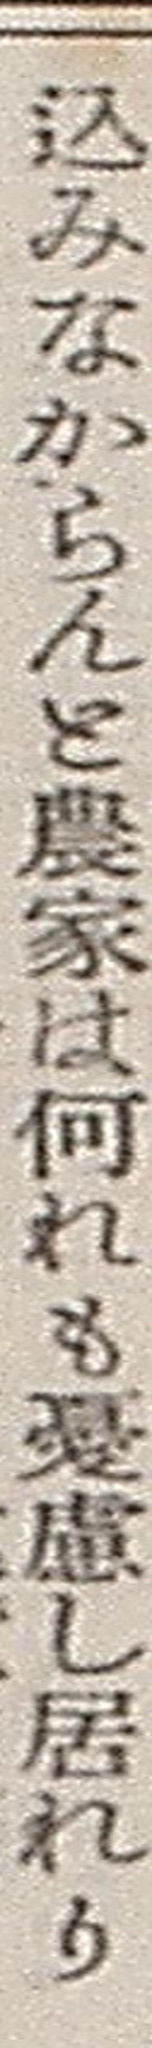込みなからんと農家は何れも憂慮し居れり
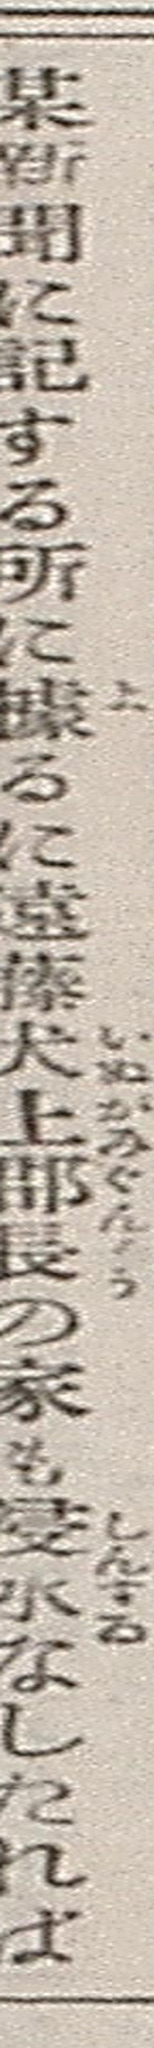某新聞に記する所に拠るに遠藤犬上郡長の家も浸水なしたれば
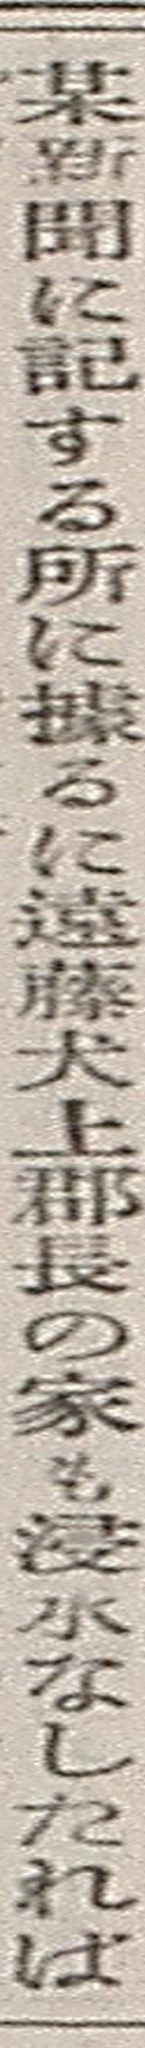某新聞に記する所に拠るに遠藤犬上郡長の家も浸水なしたれば
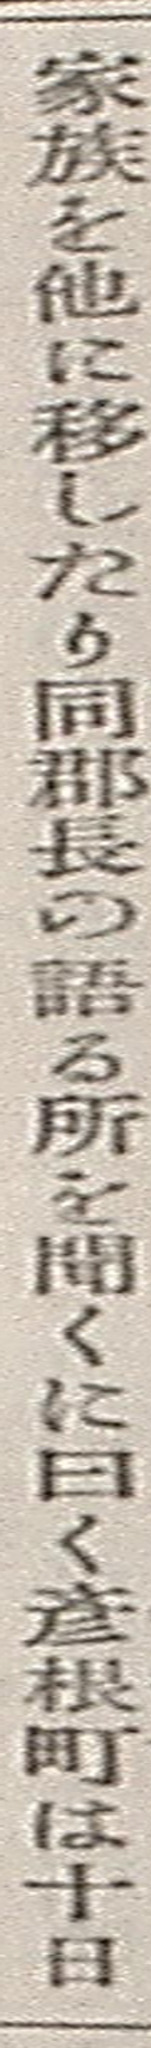家族を他に移したり同郡長の語る所を聞くに曰く彦根町は十日

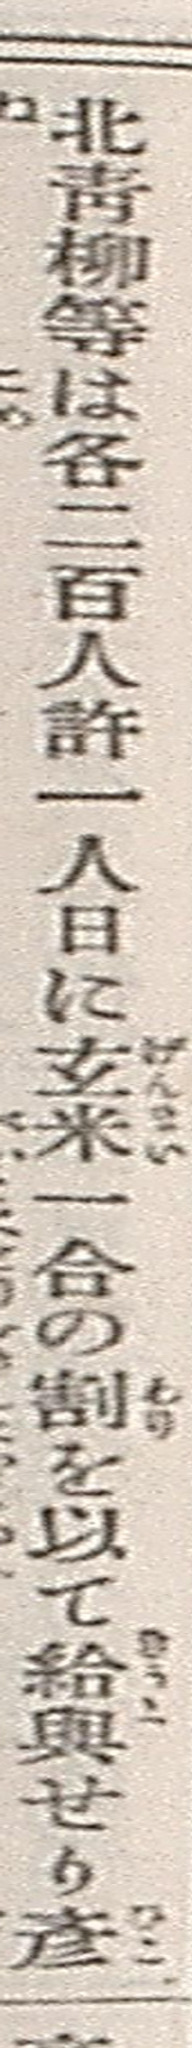北青柳等は各二百人許一人日に玄米一合の割を以て給与せり彦
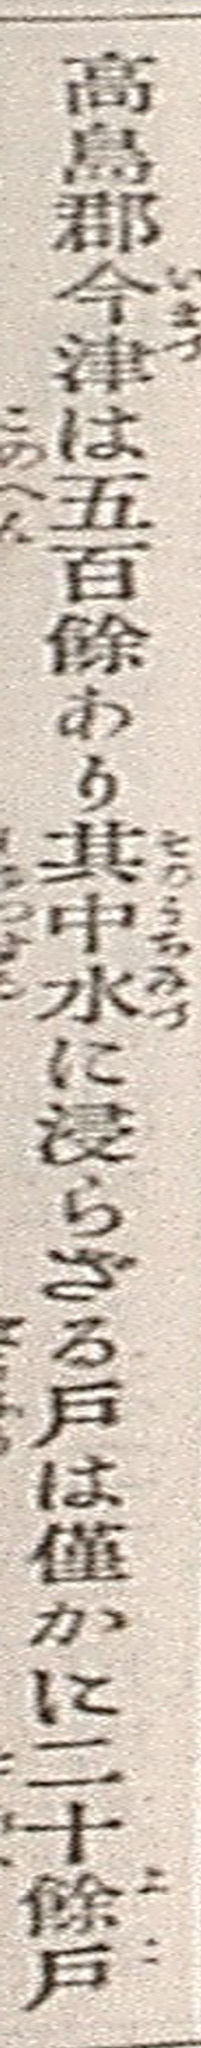高島郡今津は五百餘あり其中水に浸らざる戸は僅かに二十餘戸
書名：風俗畫報臨時増刊第百二十八號　洪水被害録（下）
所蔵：東京大学地震研究所図書室 Earthquake Research Institute Library, The University of Tokyo, JAPAN
